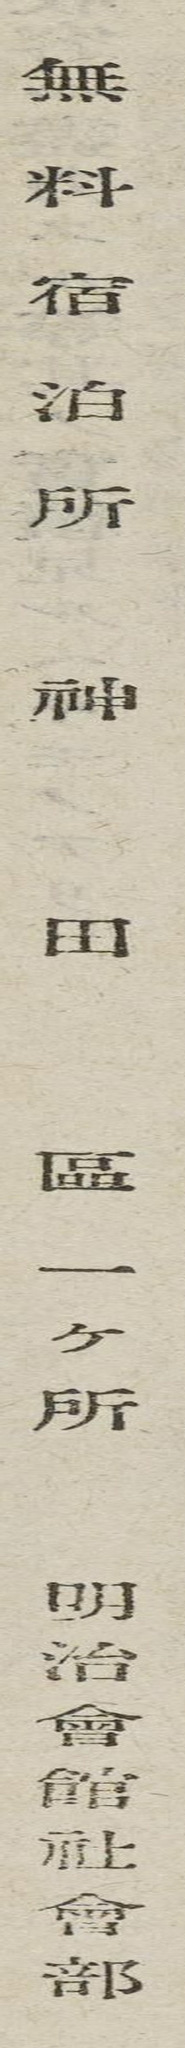無料宿泊所神田区一ケ所明治会館社会部
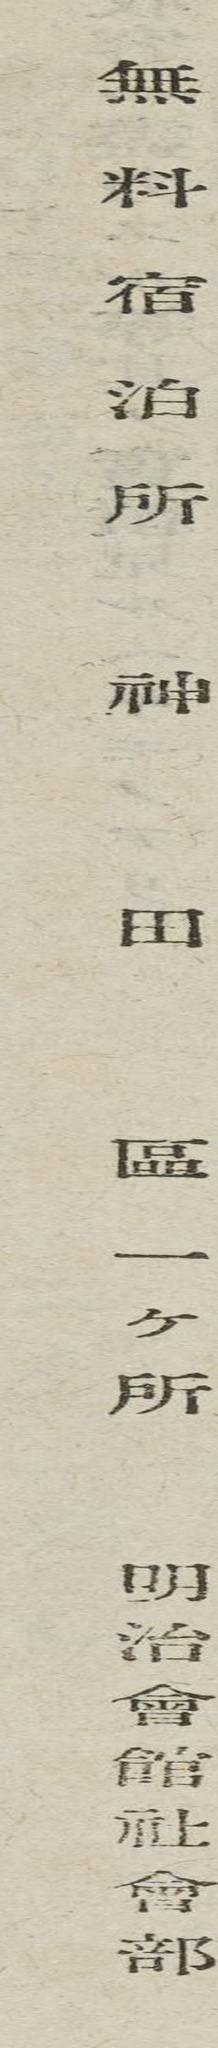無料宿泊所神田区一ケ所明治会館社会部
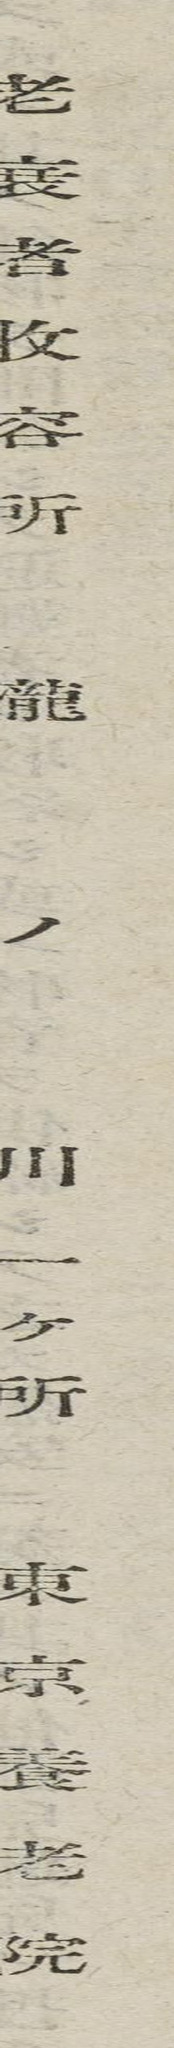老衰者収容所瀧ノ川一ケ所東京養老院
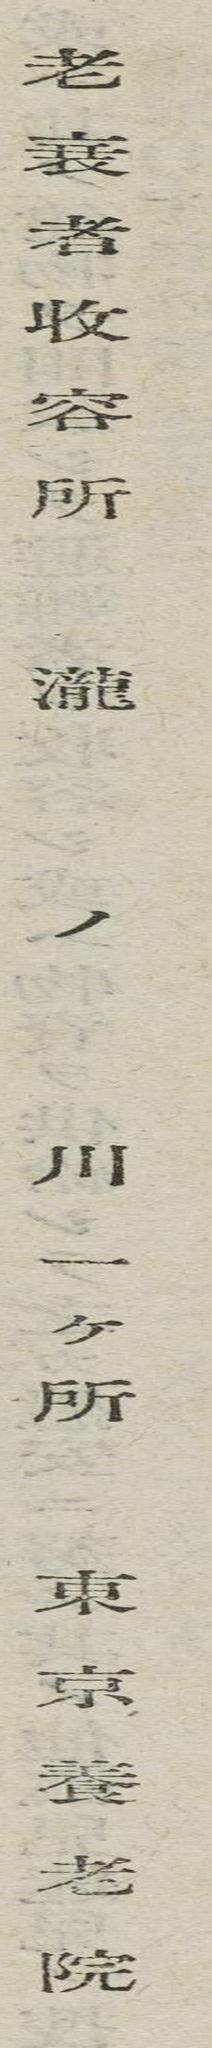老衰者収容所瀧ノ川一ケ所東京養老院
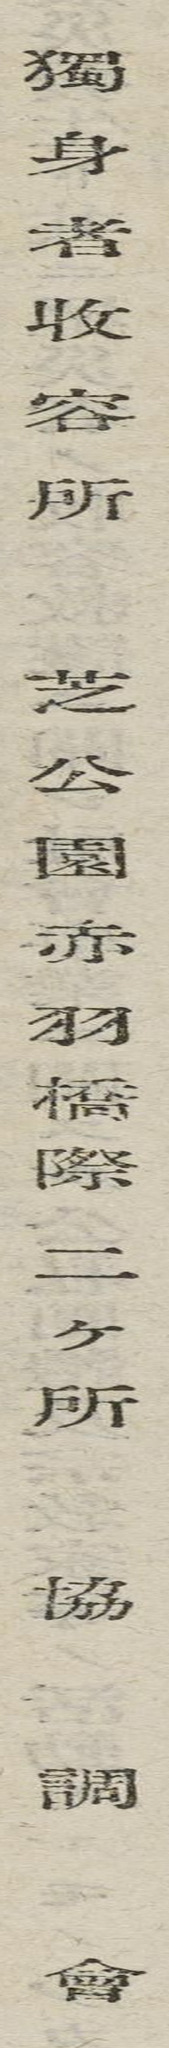独身者収容所芝公園赤羽橋際ニケ所協調会
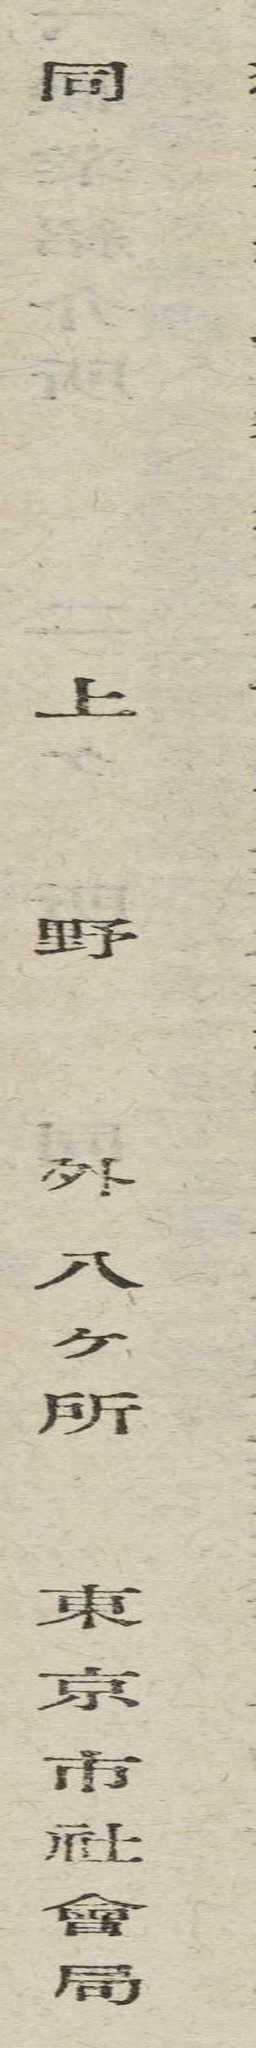同上野外八ケ所東京市社会局
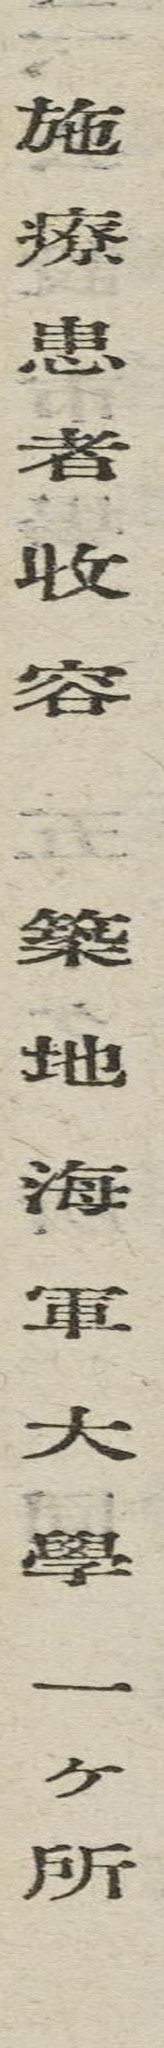施療患者収容築地海軍大学一ケ所同
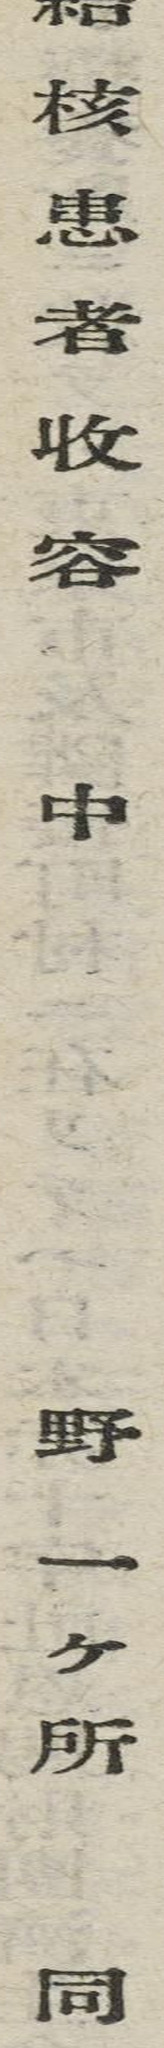結核患者収容中野一ケ所同
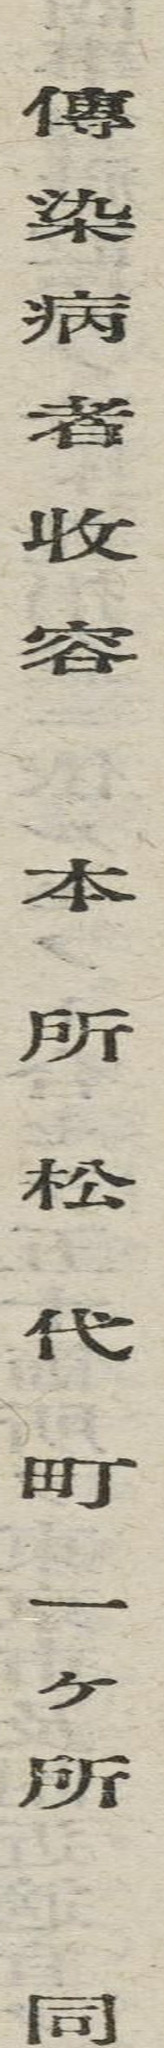伝染病者収容本所松代町一ケ所同
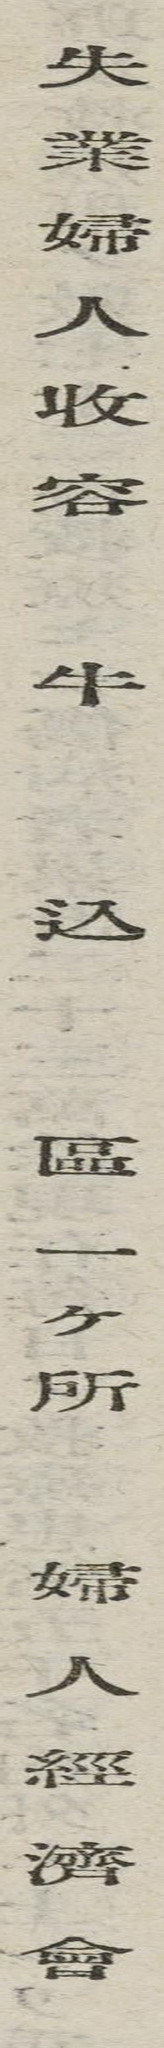失業婦人収容牛込区一ケ所婦人経済会
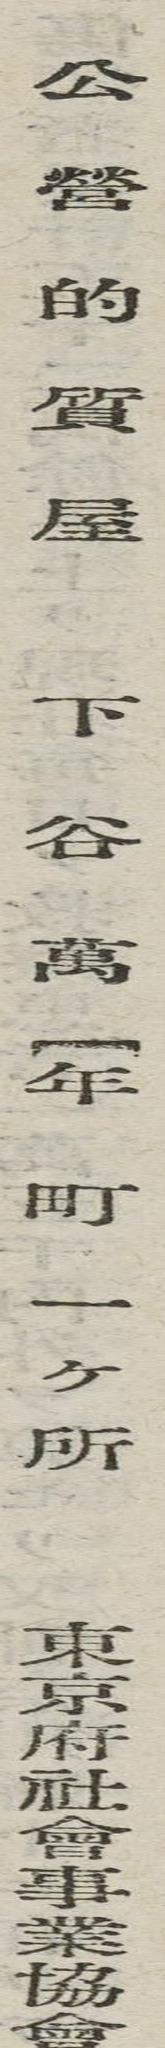公営的質屋下谷万年町一ケ所東京府社会事業協会
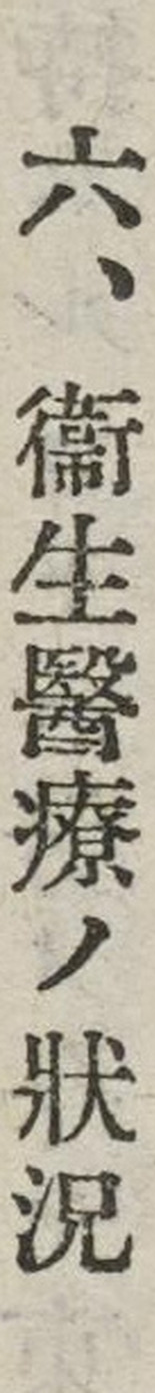六、衛生医療ノ状況
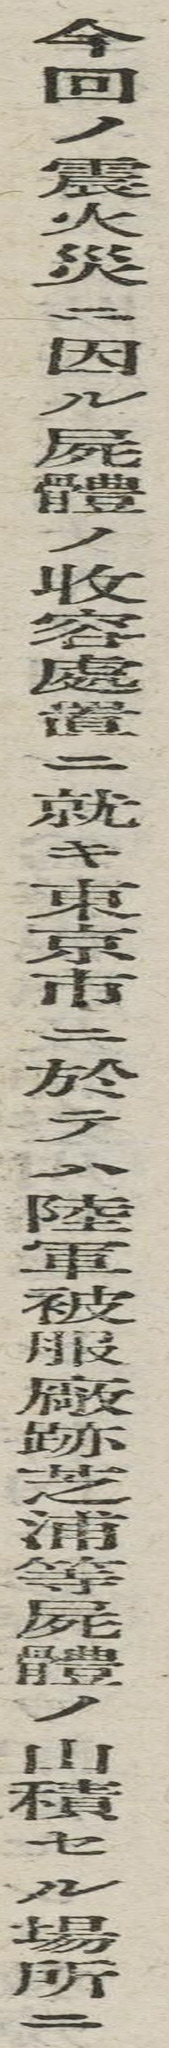今回ノ震火災ニ因ル屍体ノ収容処置ニ就キ東京市ニ於テハ陸軍被服廠跡芝浦等屍体ノ山積セル場所ニ
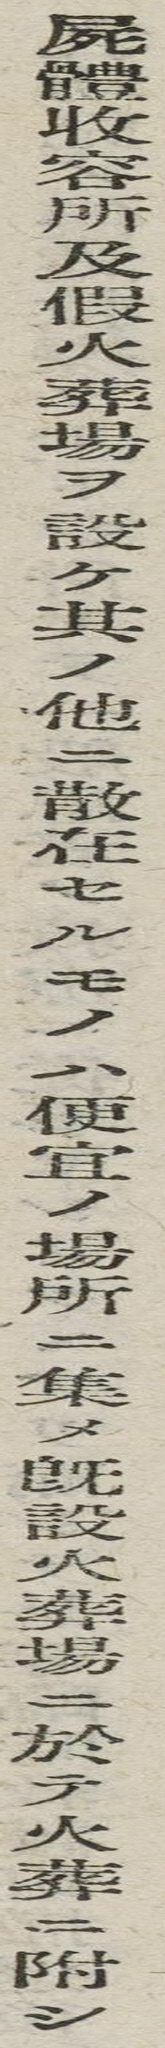屍体収容所及仮火葬場ヲ設ケ其ノ他ニ散在セルモノハ便宜ノ場所ニ集メ既設火葬場ニ於テ火葬ニ附シ
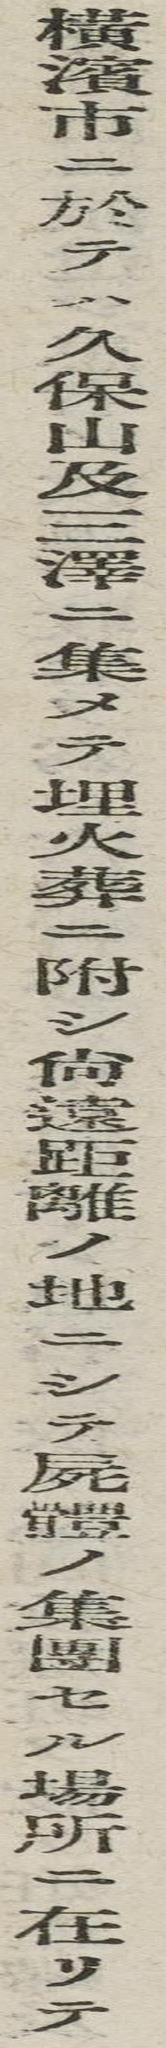横浜市ニ於テハ久保山及三澤ニ集メテ埋火葬ニ附シ尚遠距離ノ地ニシテ屍体ノ集団セル場所ニ在リテ
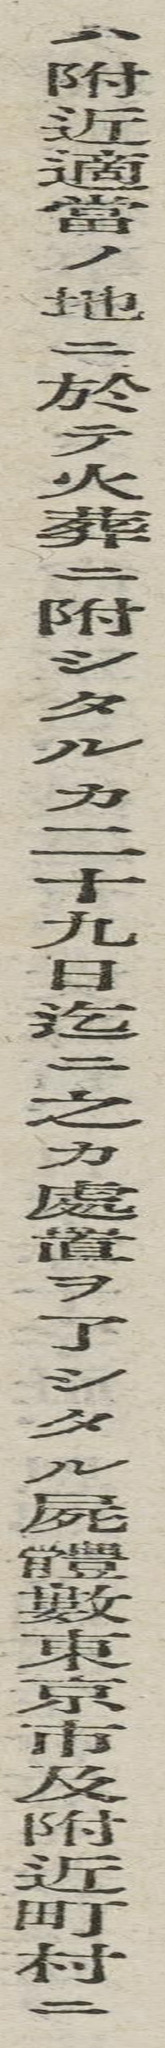ハ附近適当ノ地ニ於テ火葬ニ附シタルカ二十九日迄ニ之カ処置ヲ了シタル屍体数東京市及附近町村ニ
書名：震災被害状況並救護施設概要
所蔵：東京大学地震研究所図書室 Earthquake Research Institute Library, The University of Tokyo, JAPAN
